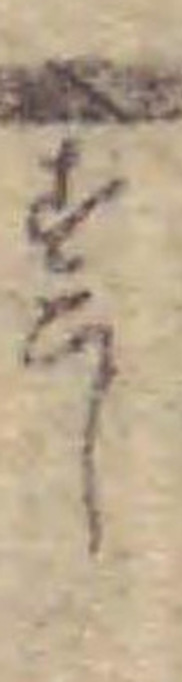すこし
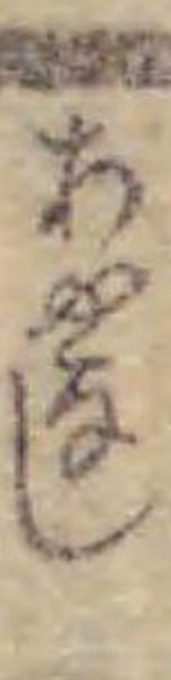あやなし
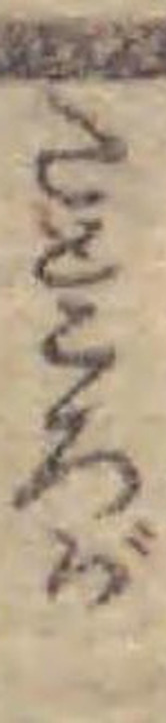たところが
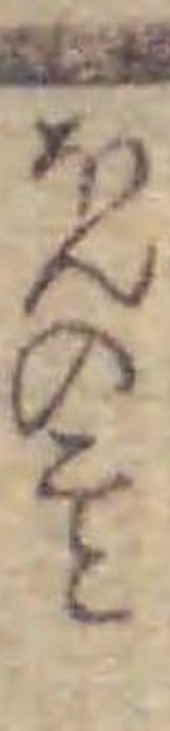ほんのこと
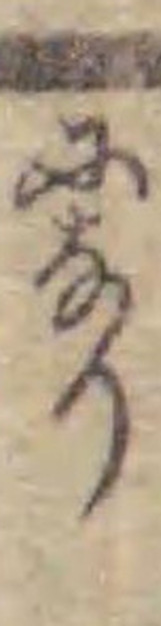になり
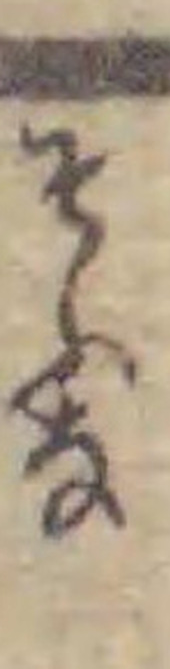そふな
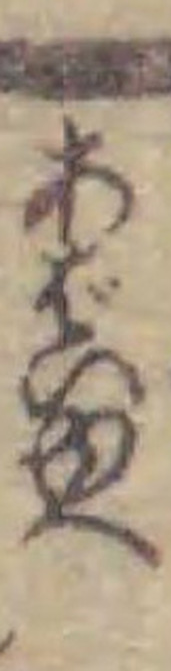あばいゆへ
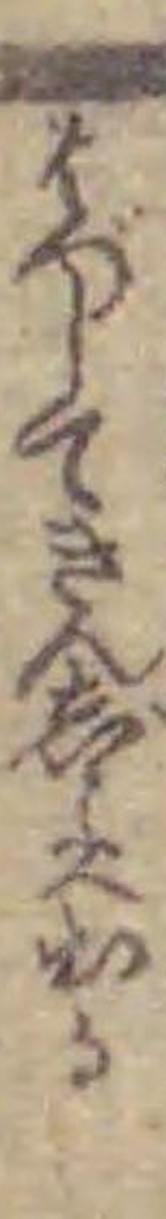はづしてきんじよへ出る

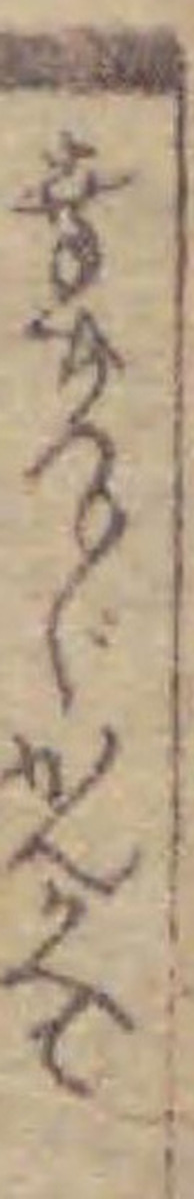幸介つく〴〵かんかえて
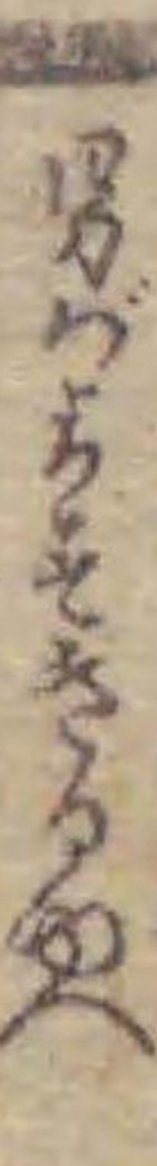男がよすきるゆへ
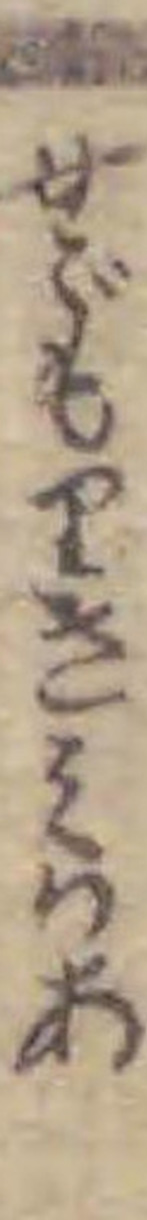女どもりきみはあ
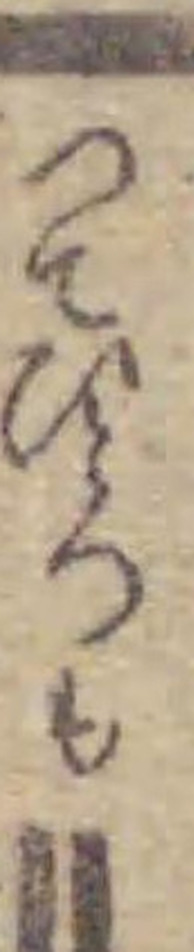つてひとつも
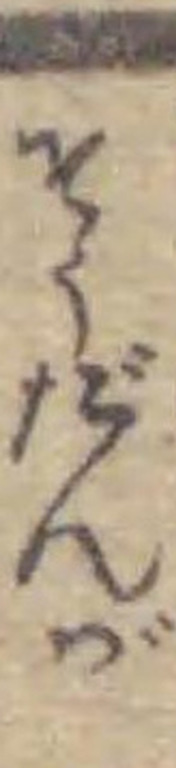そうだんが
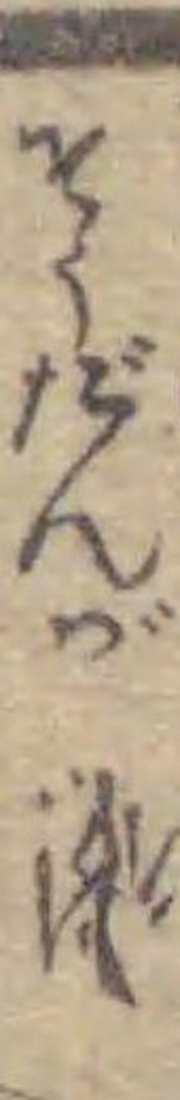そうだんが
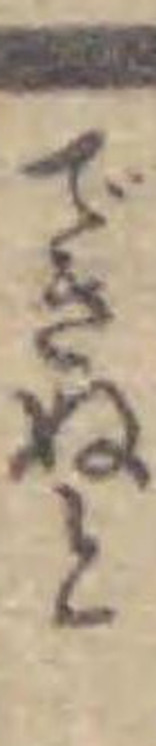できぬと
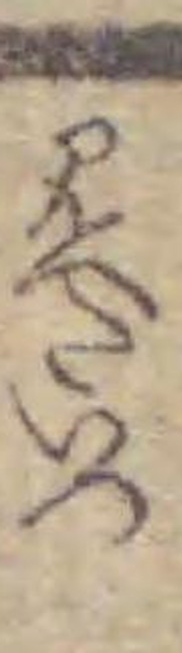見へたいつ
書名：通風伊勢物語 : 3巻
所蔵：国立国会図書館 National Diet Library, JAPAN
